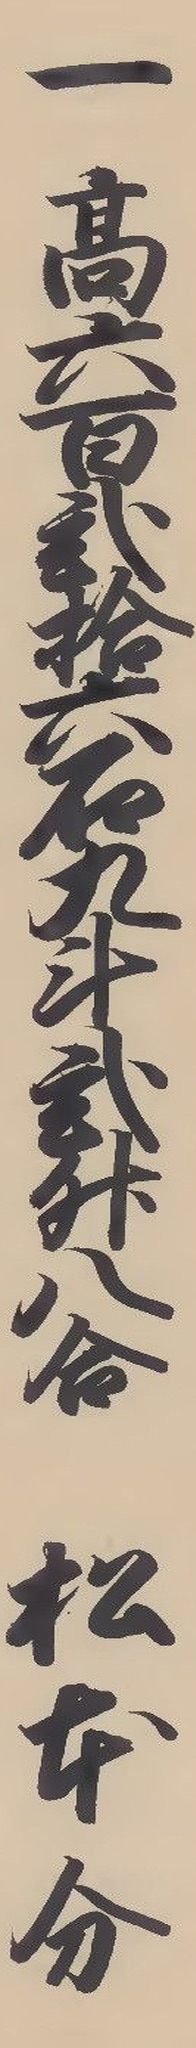一高六百弐拾六石九斗弐升八合松本分
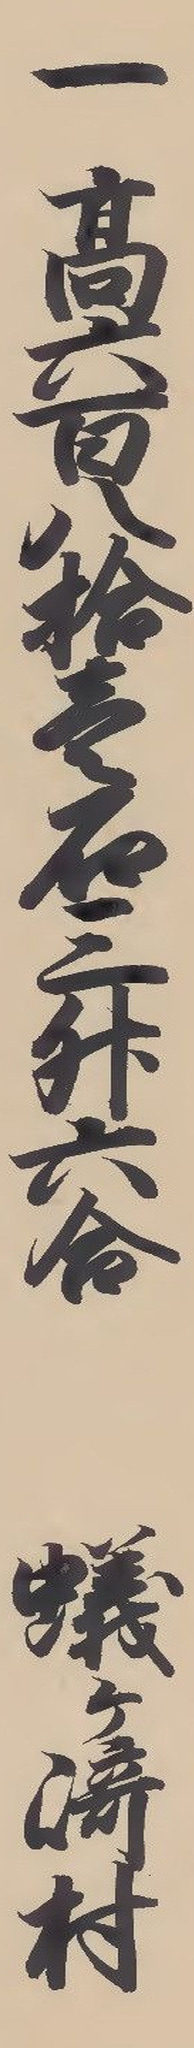一高六百八拾壱石三升六合蟻ヶ崎村
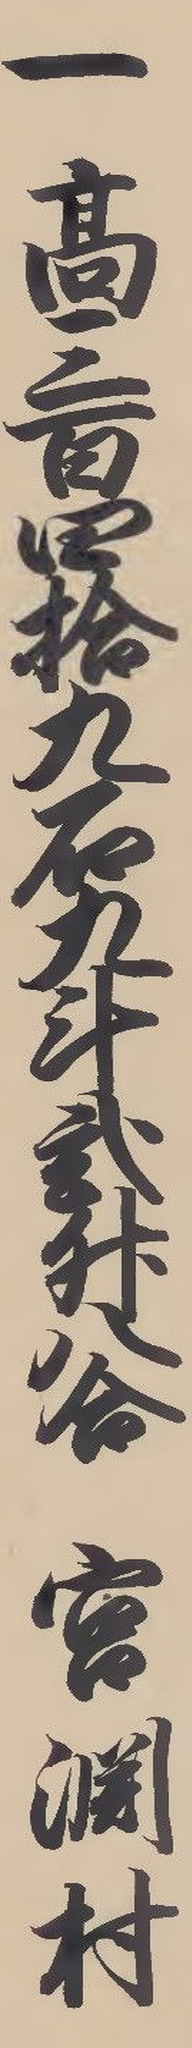一高三百四拾九石九斗弐升八合宮淵村
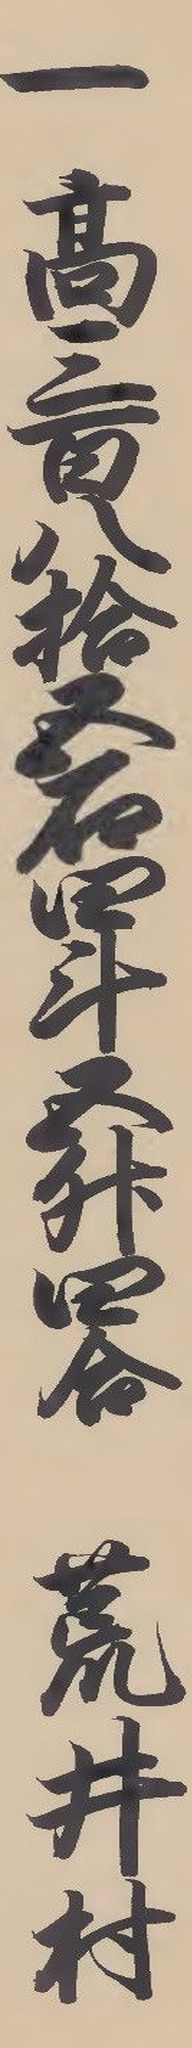一高三百八拾五石四斗五升四合荒井村
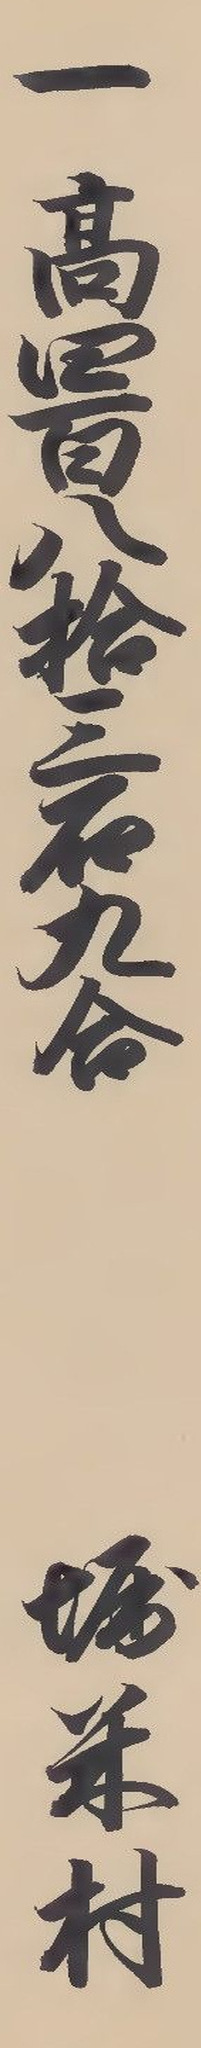一高四百八拾三石九合堀米村
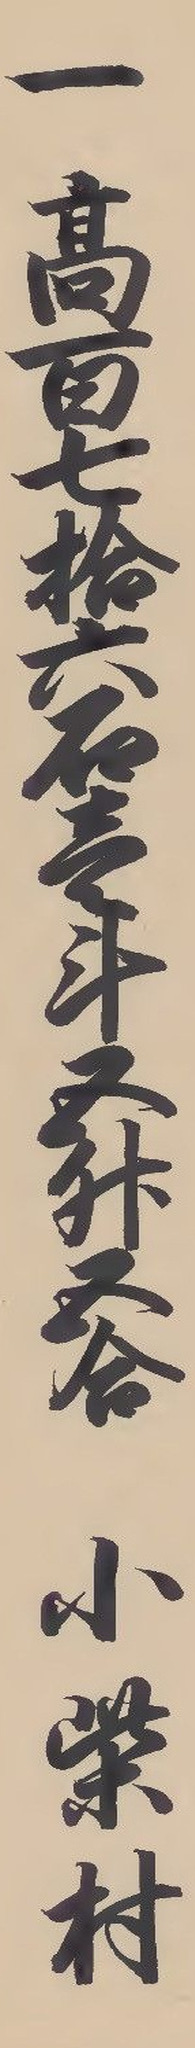一高百七拾六石壱斗五升五合小柴村

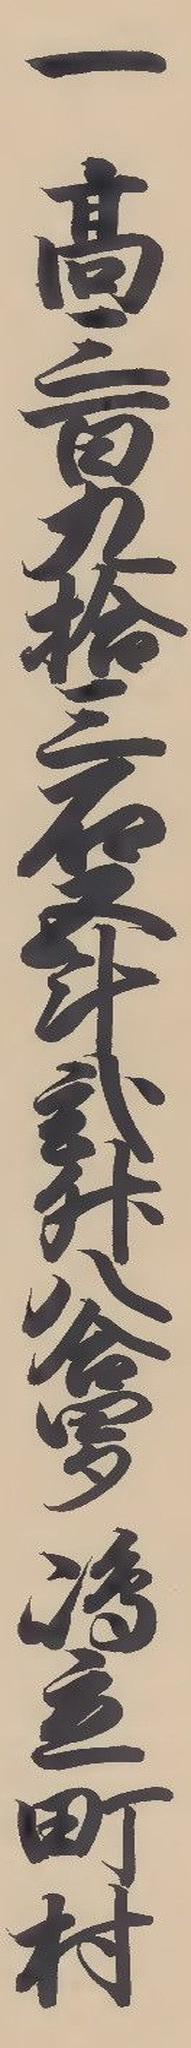一高三百九拾三石五斗弐升八合四勺島立町村
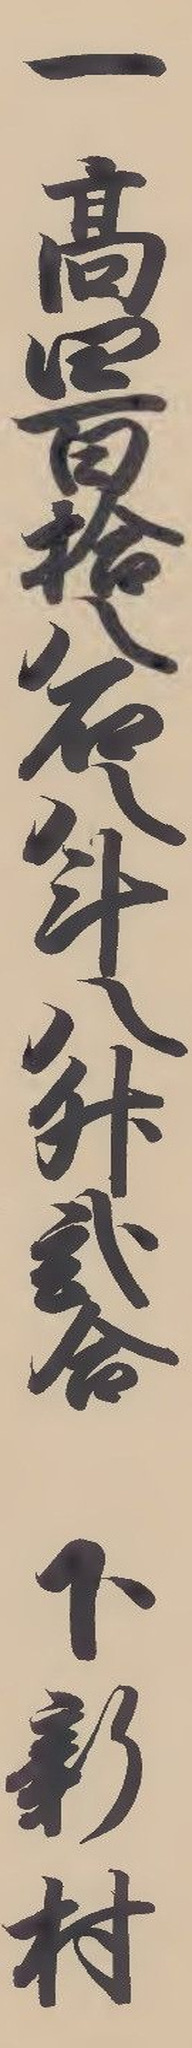一高四百拾八石八斗八升弐合下新村
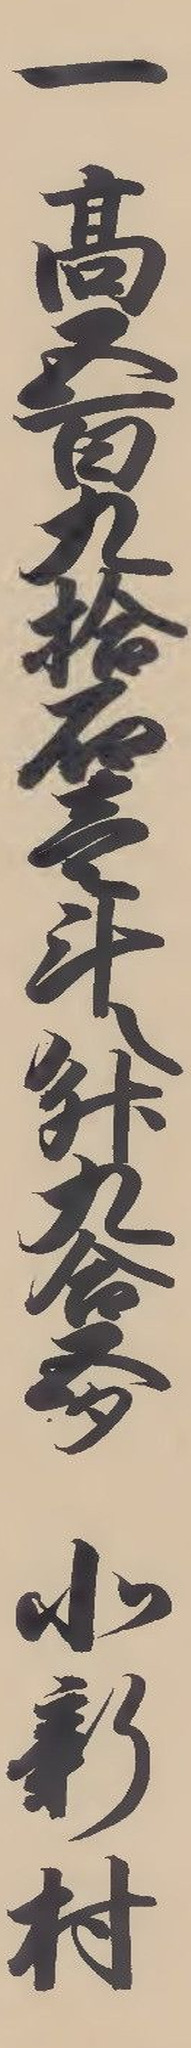一高五百九拾石壱斗八升九合五勺北新村
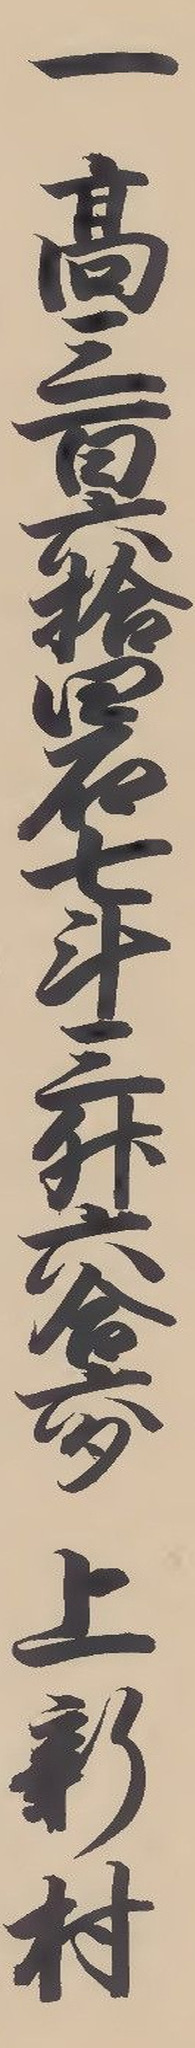一高三百六拾四石七斗三升六合六勺上新村
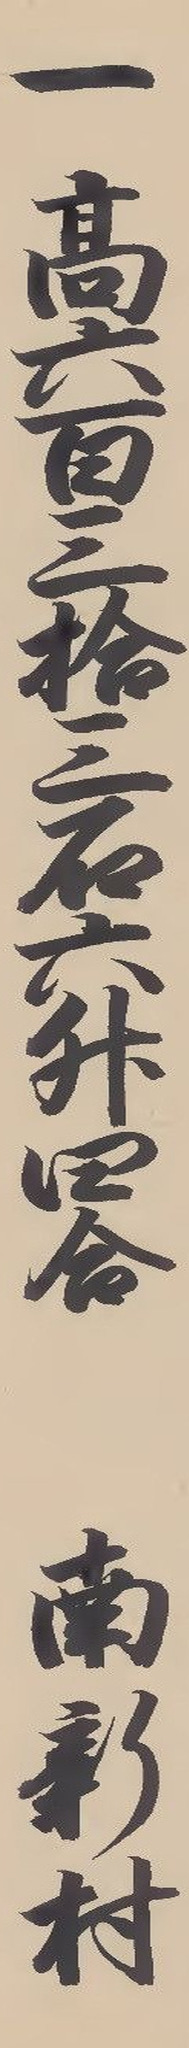一高六百三拾三石六升四合南新村
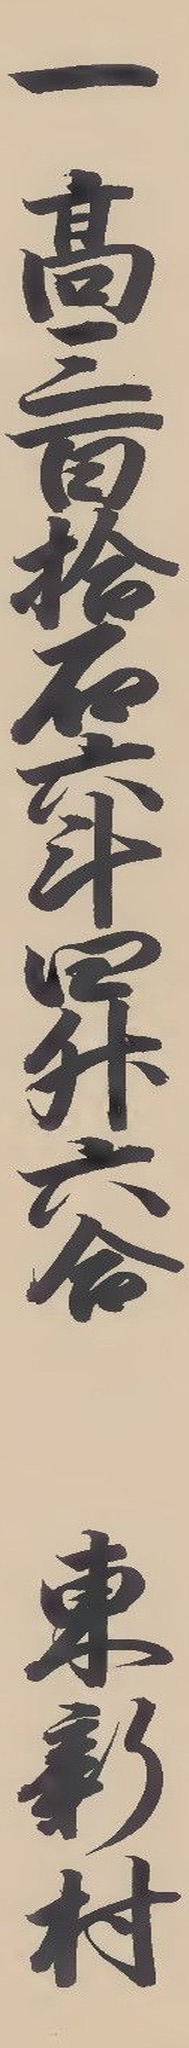一高三百拾石六斗四升六合東新村
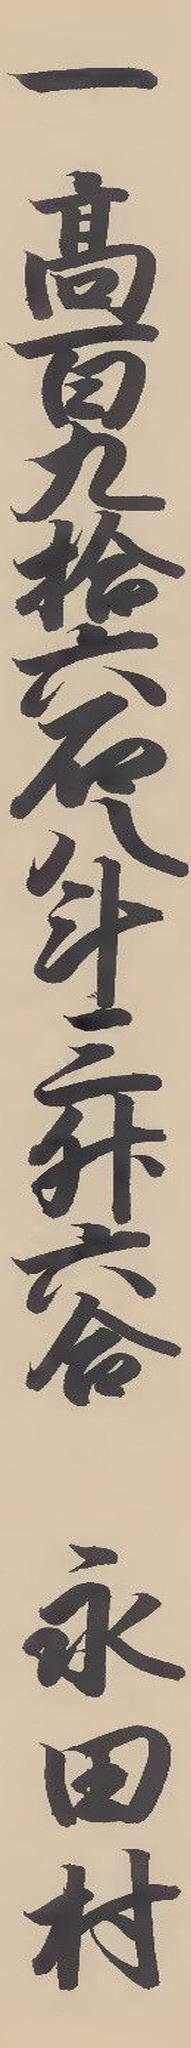一高百九拾六石八斗三升六合永田村

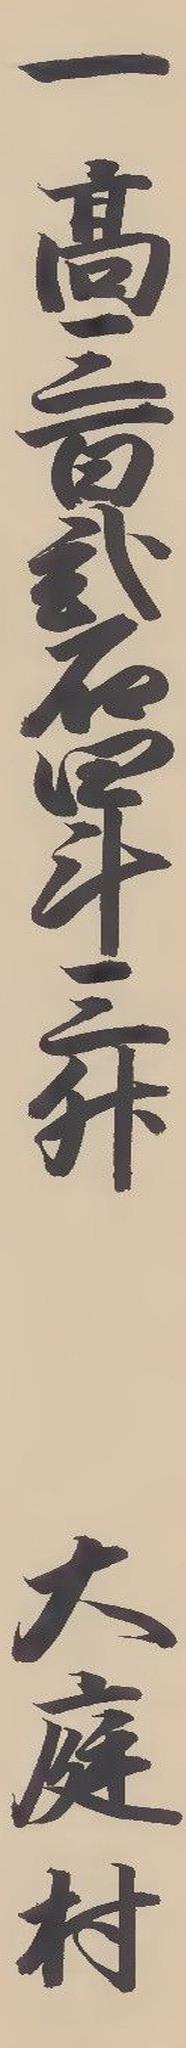一高三百弐石四斗三升大庭村
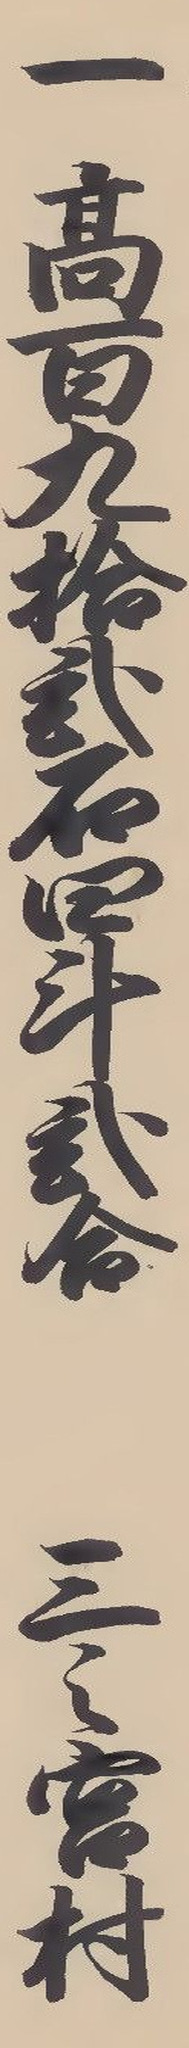一高百九拾弐石四斗弐合三之宮村
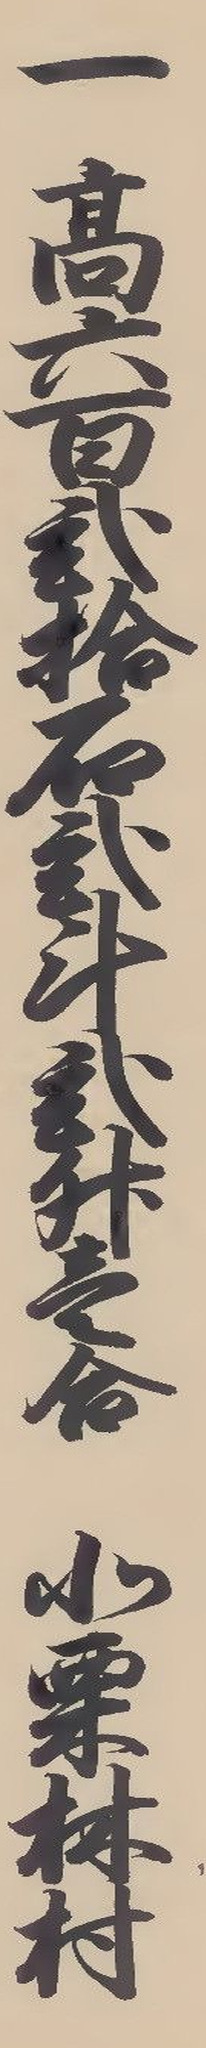一高六百弐拾石弐斗弐升壱合北栗林村
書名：信濃国郷帳
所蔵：国立公文書館 National Archives of Japan
